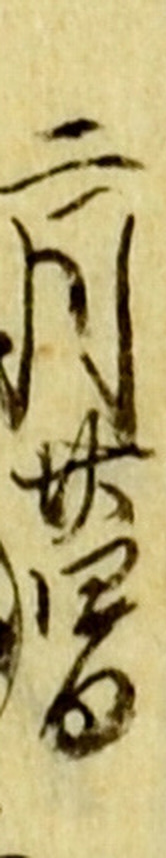二月廿四日
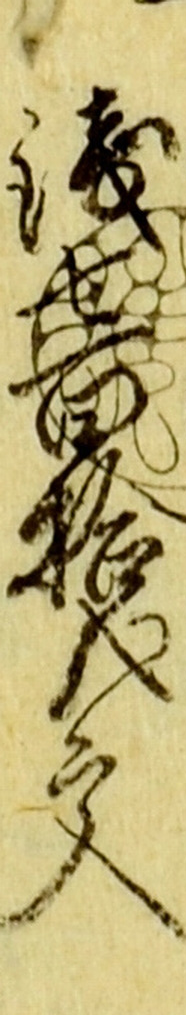銭七百拾弐文
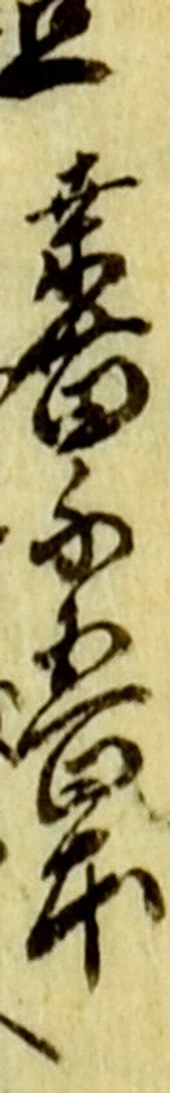但桑苗千五百本
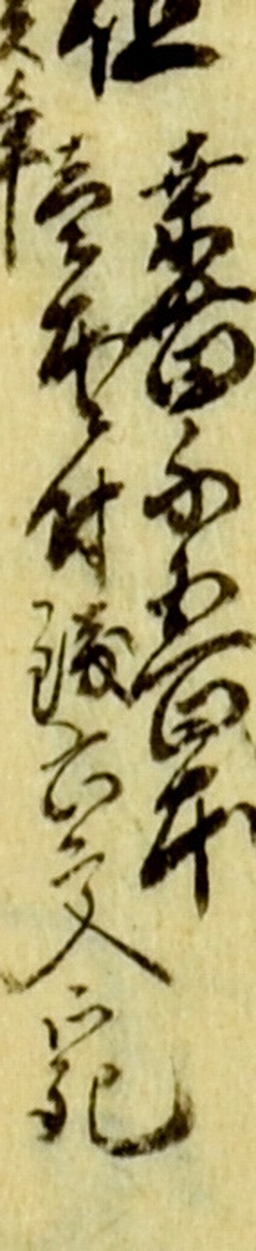壱本ニ付銭六文宛
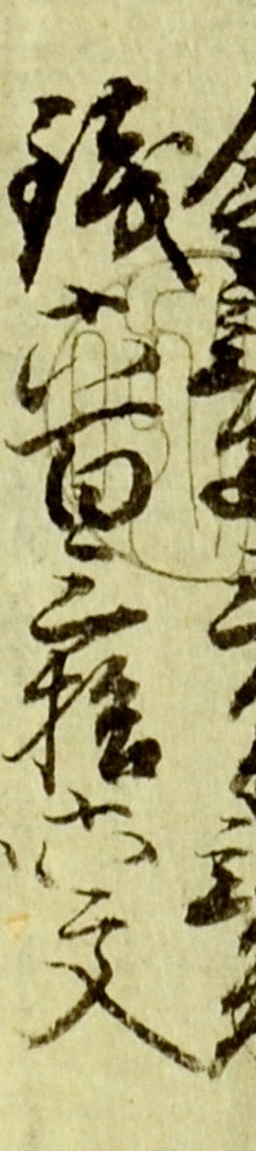銭六百三拾六文
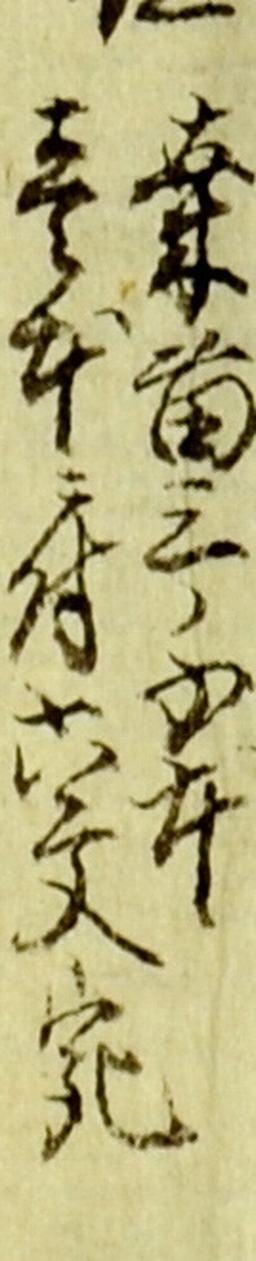壱本ニ付六文宛
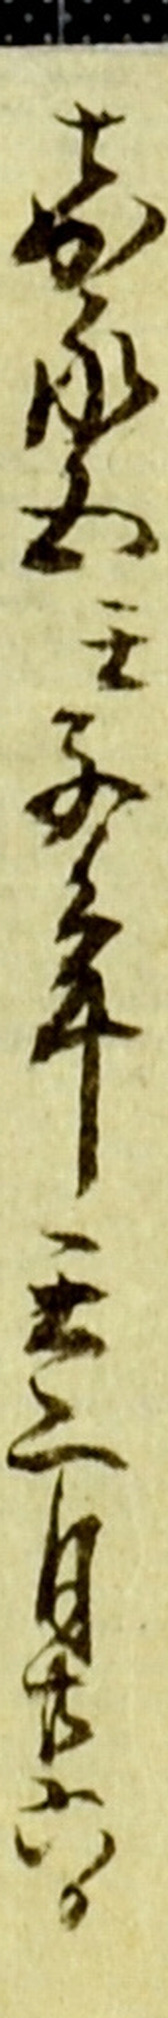嘉永五壬子年閏二月廿六日
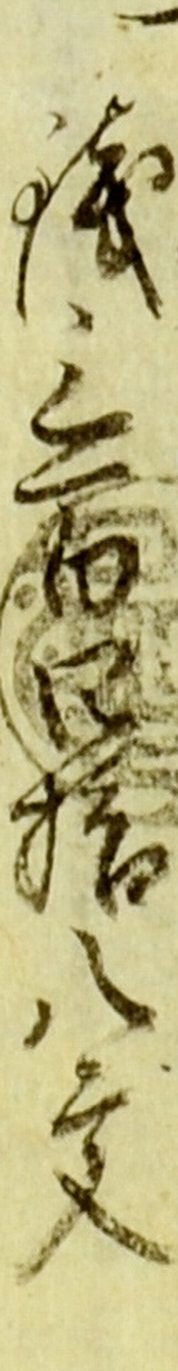銭三百四拾八文
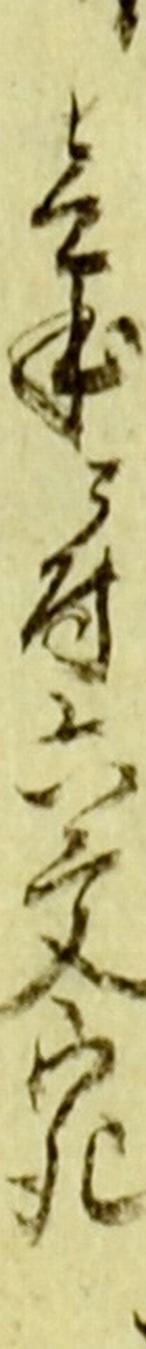壱本ニ付六文宛
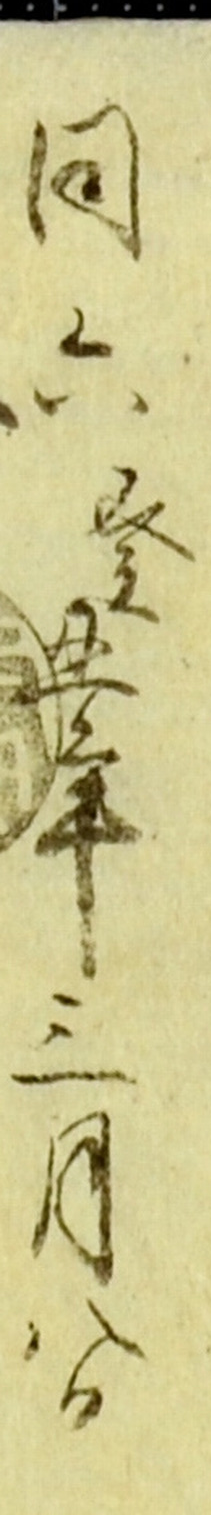同六癸丑年三月八日
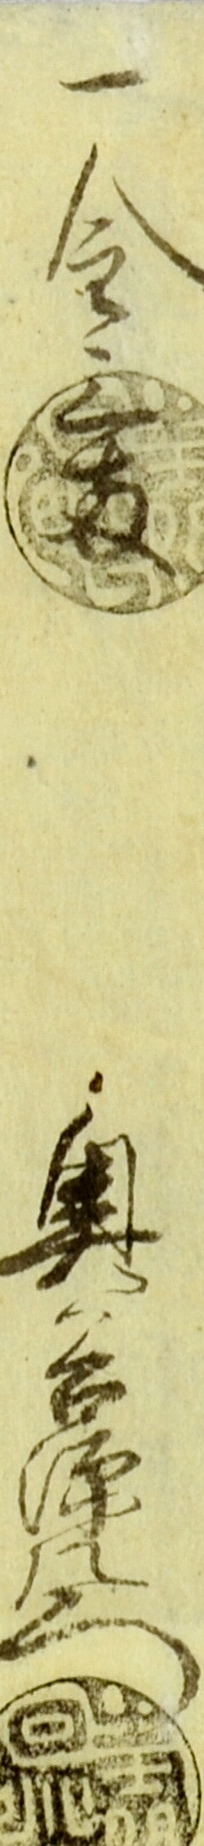一金三両奥谷源左衛門㊞

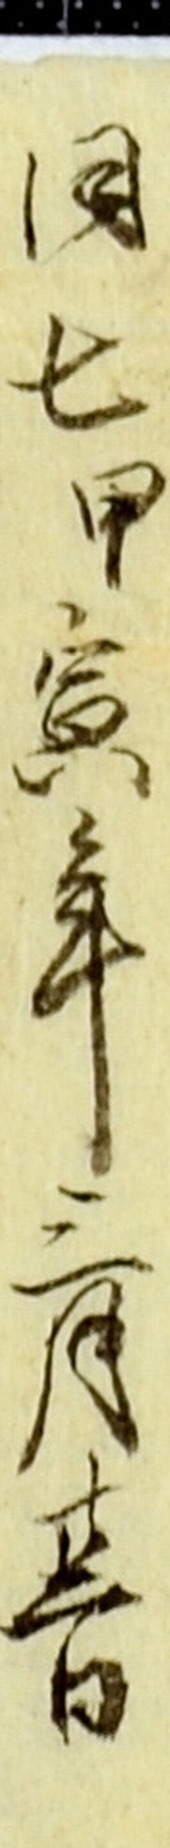同七甲寅年三月廿二日
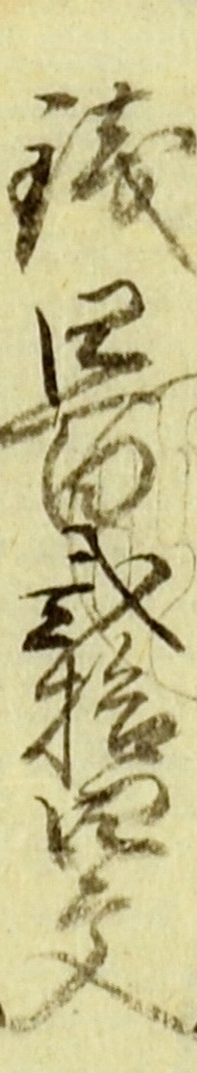銭四百弐拾四文
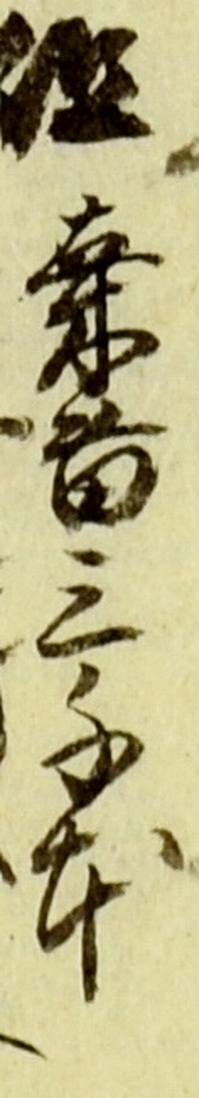但桑苗三千本
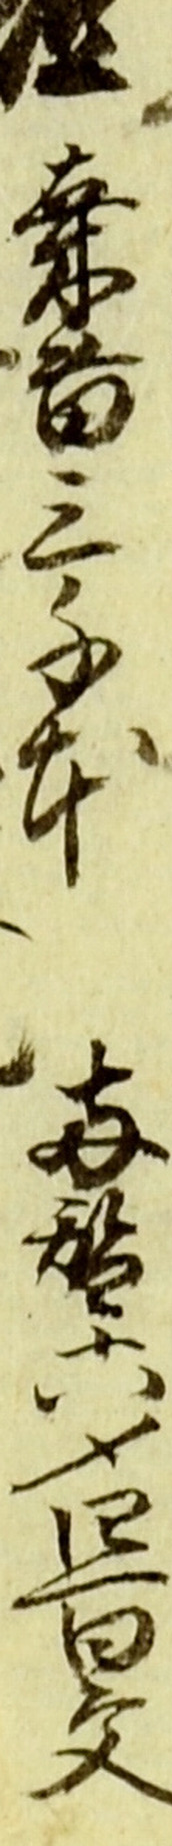但桑苗三千本両替六貫四百文
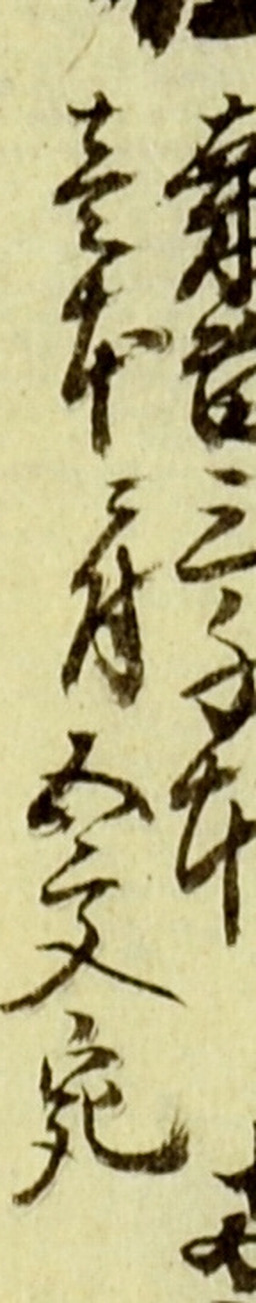壱本ニ付五文宛
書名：桑畑御入用金請取通
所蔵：伊那市立高遠町図書館・合同会社AMANE
